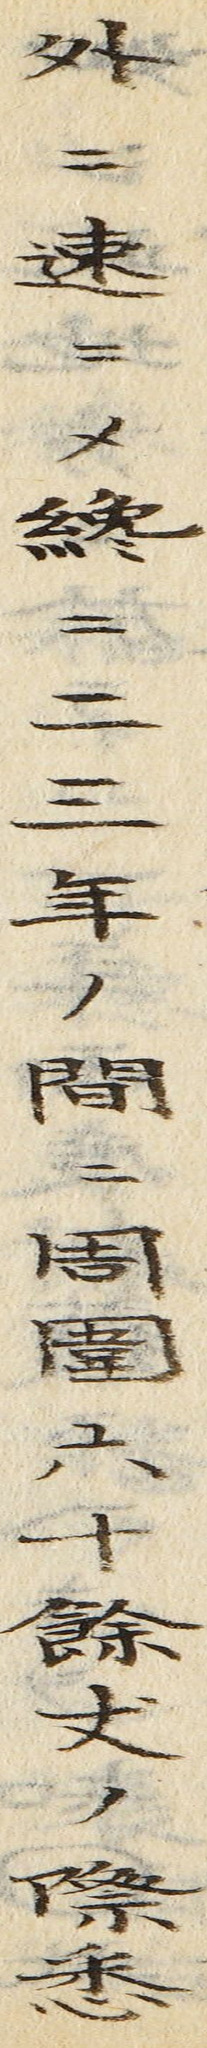外ニ速ニシテ纔ニ二三年ノ間ニ周囲六十余丈ノ際悉
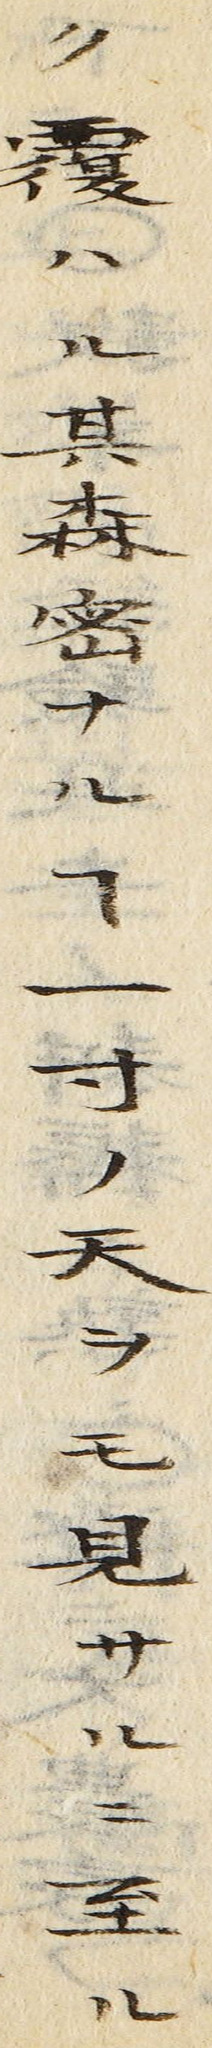ク覆ハル其森密ナルコト一寸ノ天ヲモ見サルニ至ル
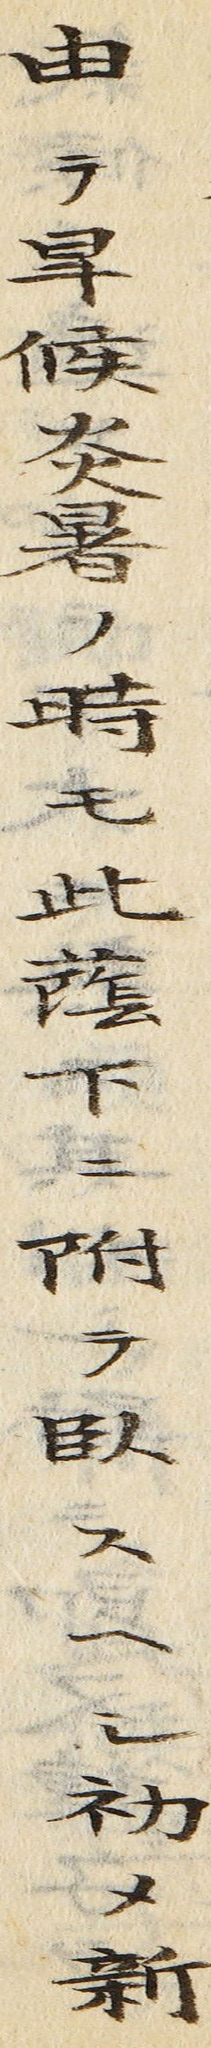由テ旱候炎暑ノ時モ此蔭下ニ附テ臥スヘシ初メ新
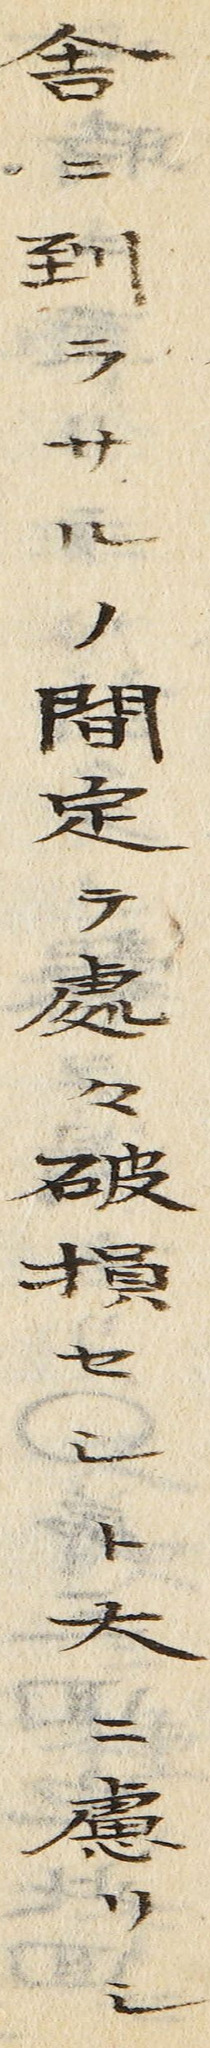舎ニ到ラサルノ間定テ処々破損セシト大ニ慮リシ
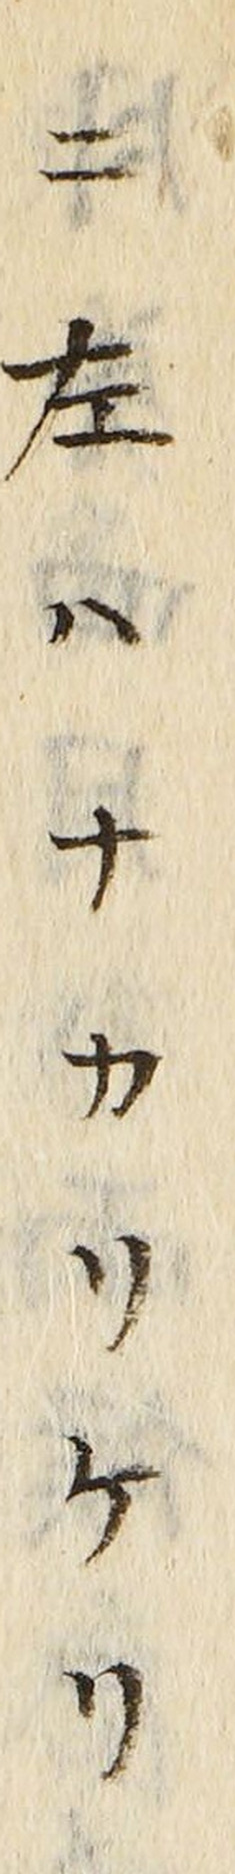ニ左ハナカリケリ
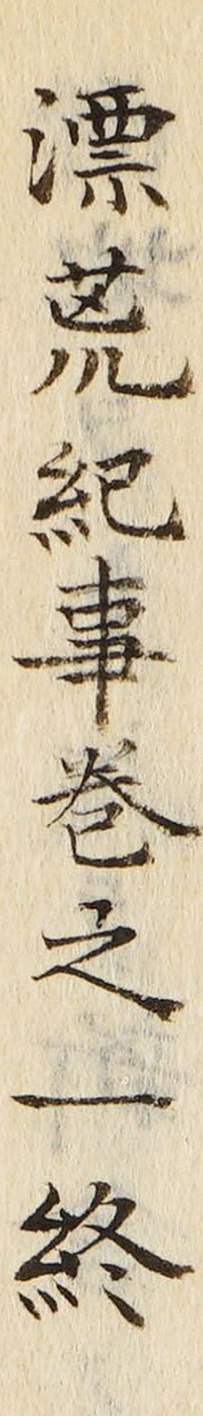漂荒紀事巻之一終

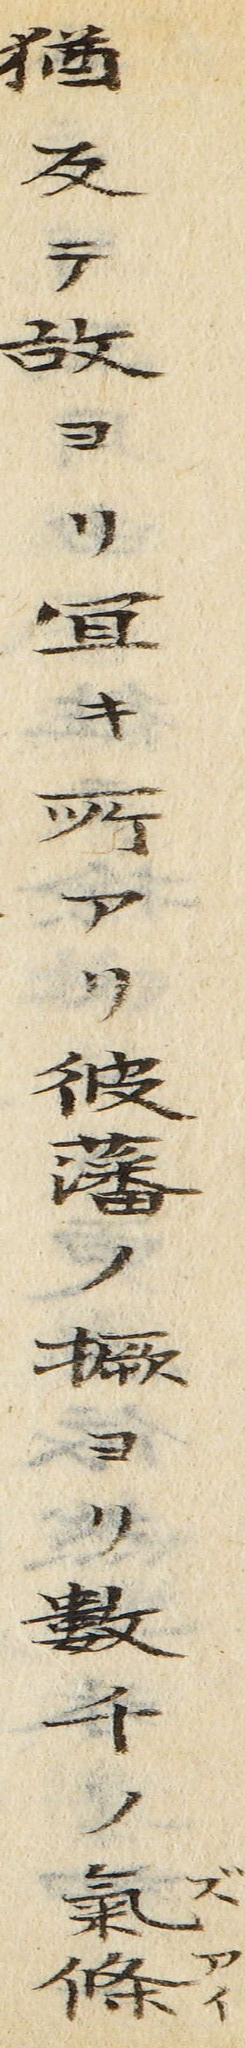猶反テ故ヨリ宜キ所アリ彼藩ノ橛ヨリ数千ノ気條
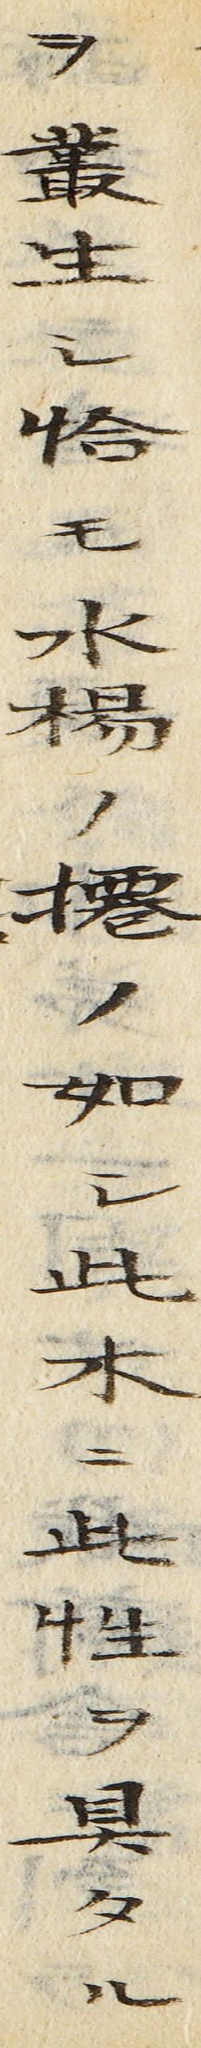ヲ叢生シ拾モ水楊ノ𢳍ノ如シ此木ニ此性ヲ具タル
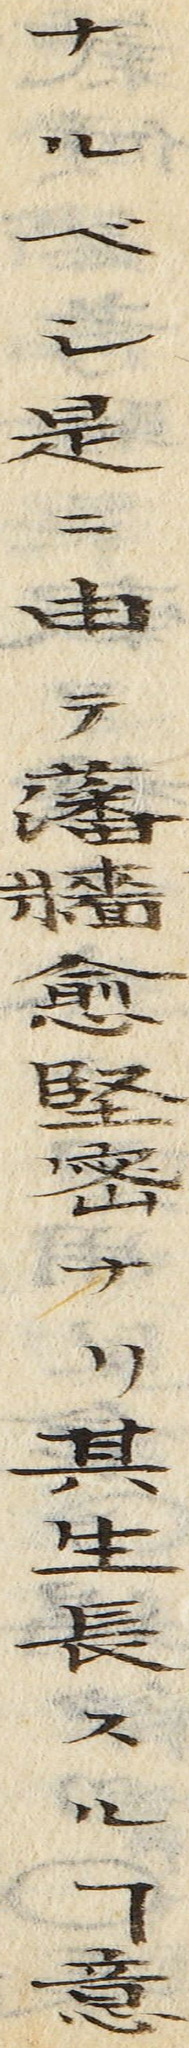ナルベシ是ニ由テ藩牆愈堅密ナリ其生長スルコト意
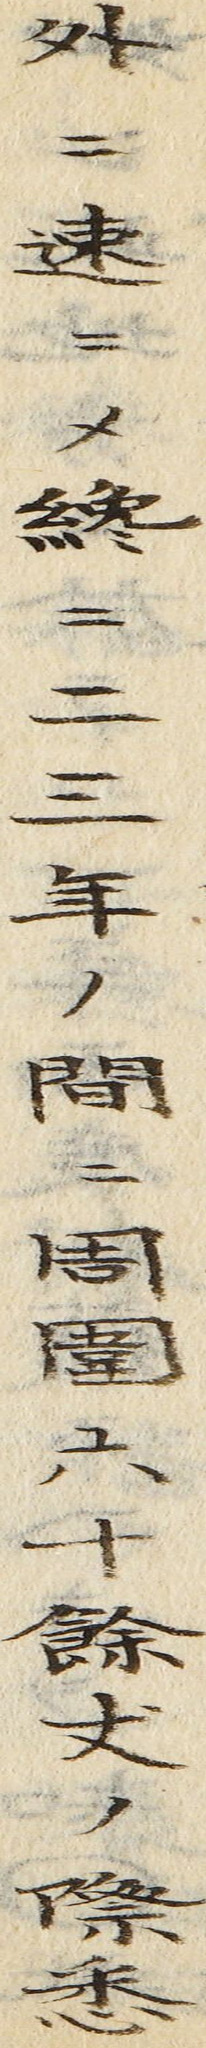外ニ速ニシテ纔ニ二三年ノ間ニ周囲六十余丈ノ際悉
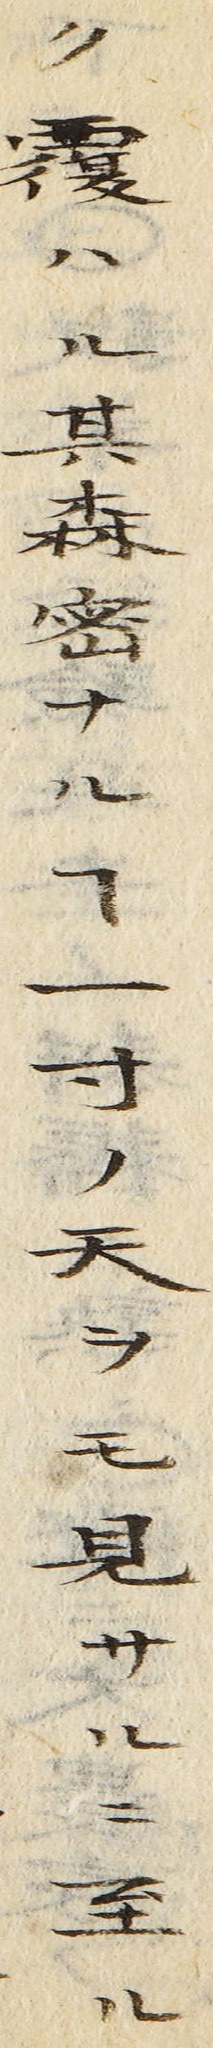ク覆ハル其森密ナルコト一寸ノ天ヲモ見サルニ至ル
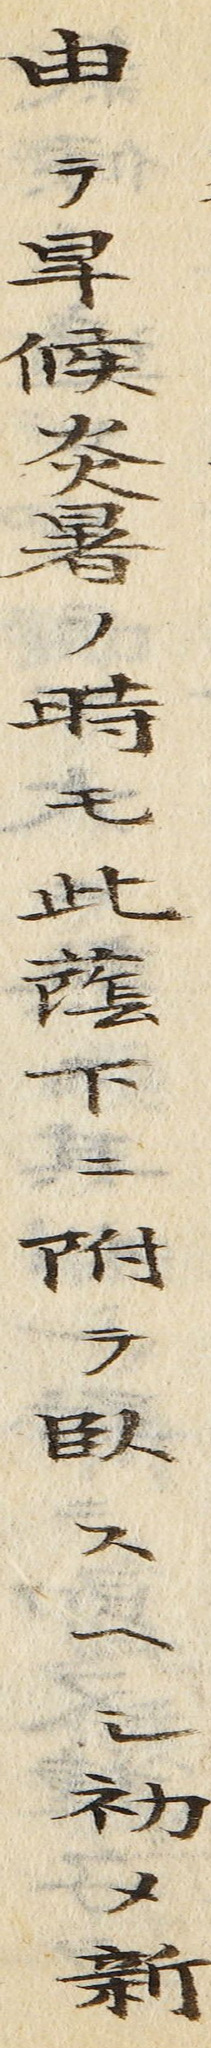由テ旱候炎暑ノ時モ此蔭下ニ附テ臥スヘシ初メ新
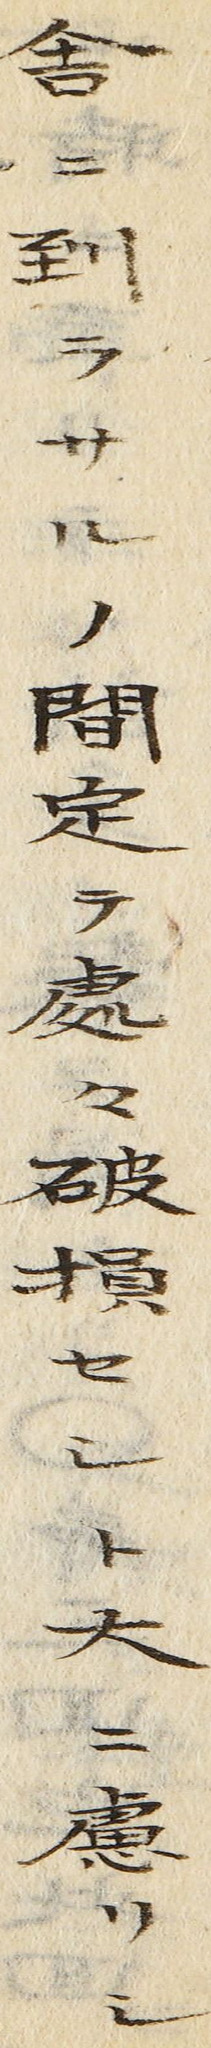舎ニ到ラサルノ間定テ処々破損セシト大ニ慮リシ
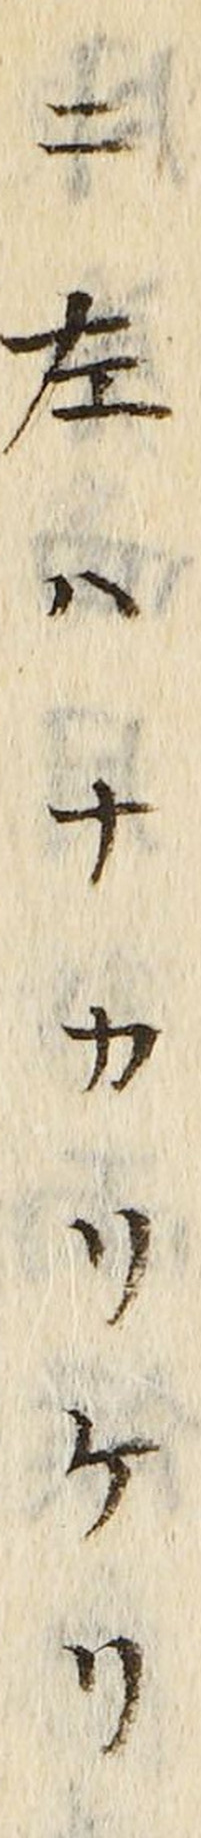ニ左ハナカリケリ
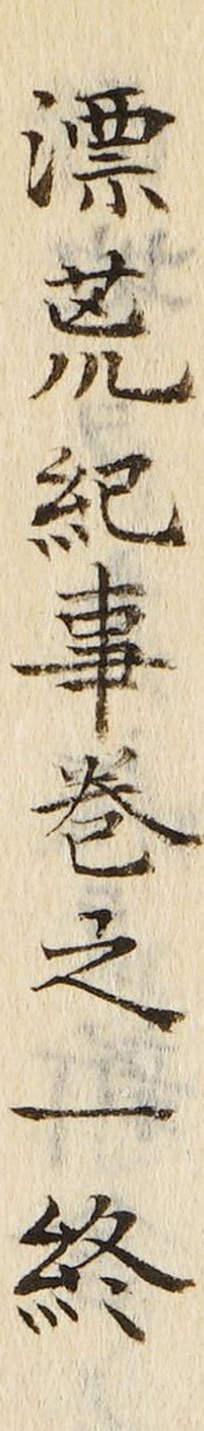漂荒紀事巻之一終

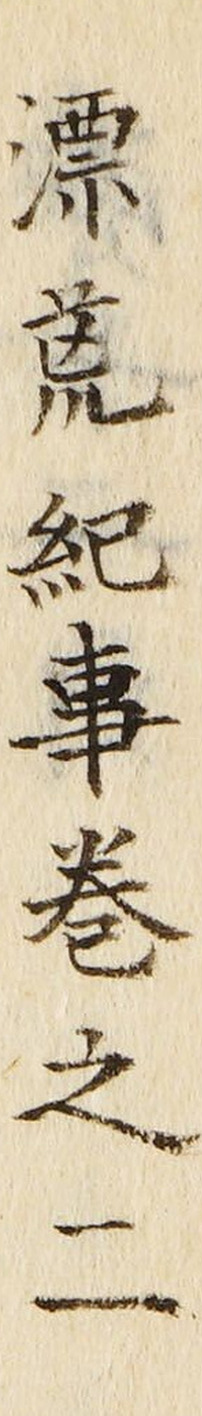漂荒紀事巻之二
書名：漂流紀事
